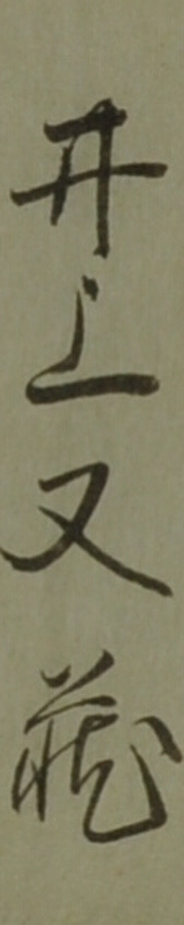井上又蔵
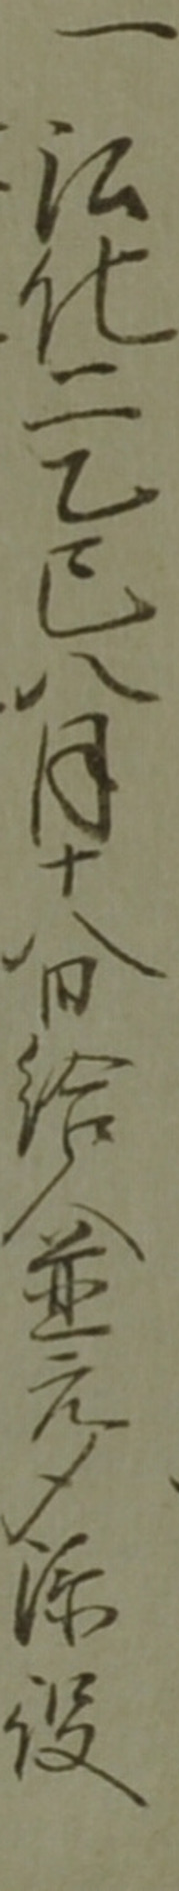一弘化二乙巳八月十八日給人並元〆添役
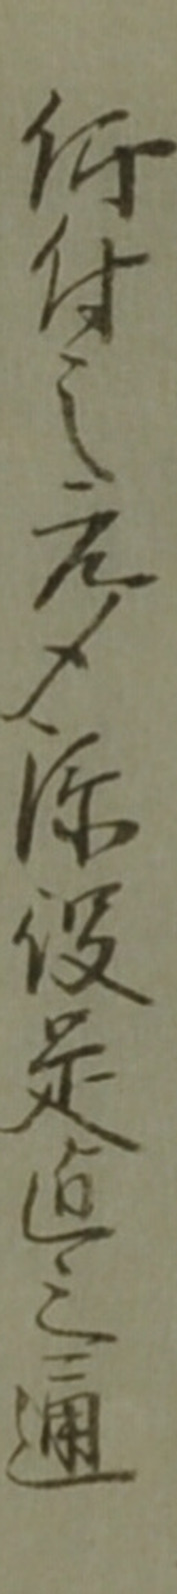仰付之元〆添役是迄之通
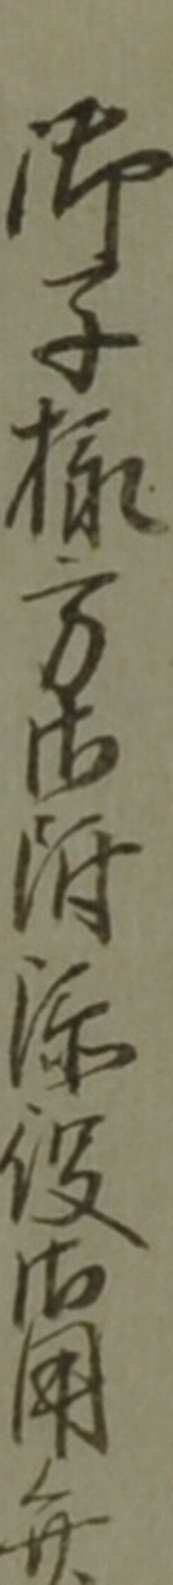御子様方御附添役御用弁被
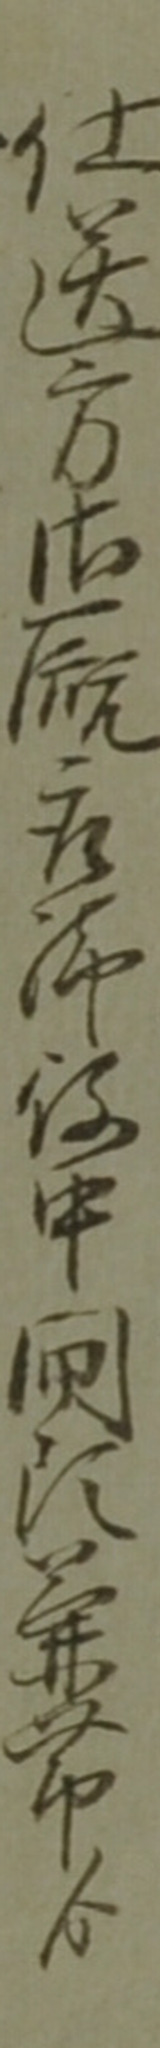仕送方御厩取締役中閘頭兼帯ゟ

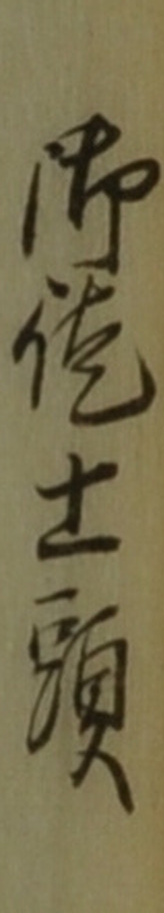御徒士頭
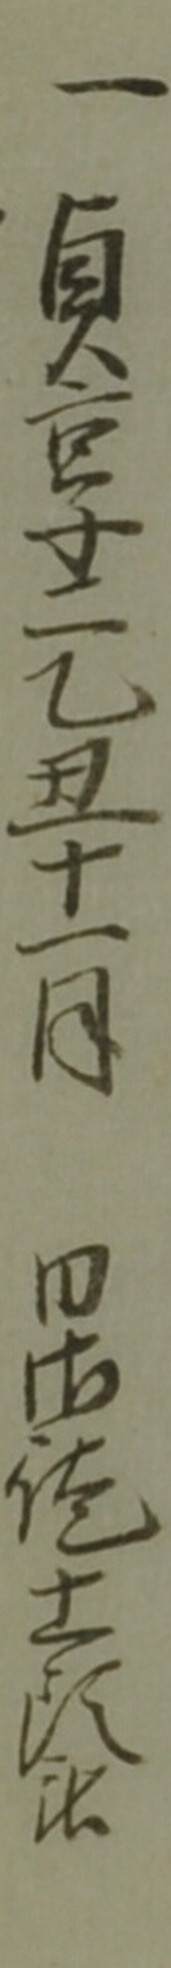一貞享二乙丑十一月日御徒士頭被
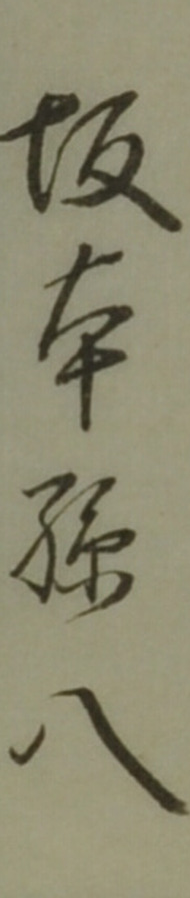坂本孫八
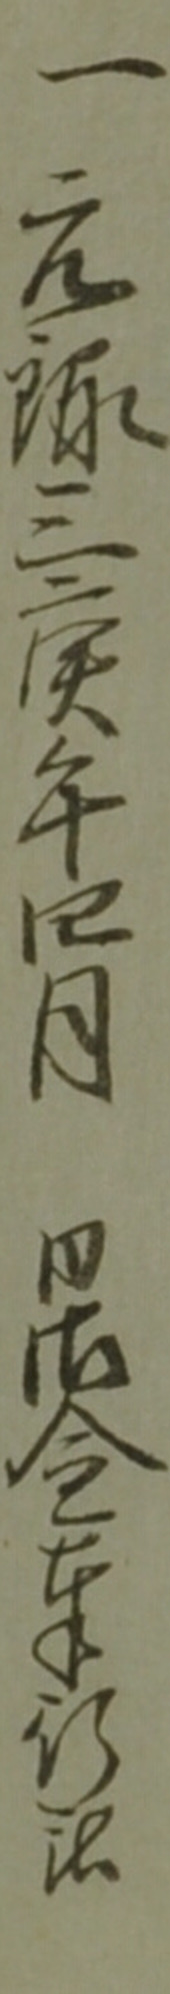一元禄三庚午四月日御金奉行被
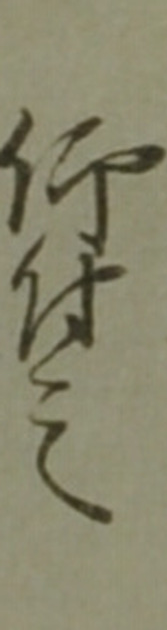仰付之
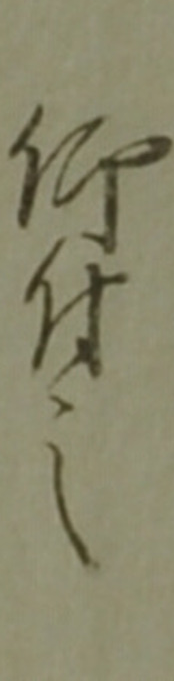仰付之
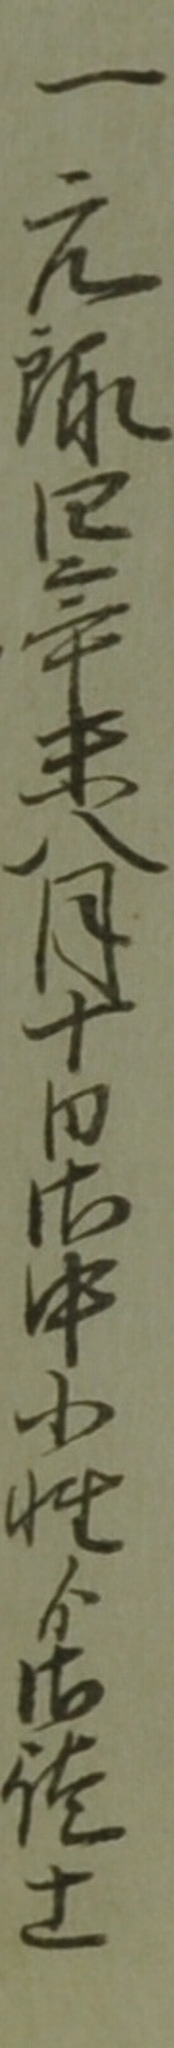一元禄四辛未八月十日御中小性ゟ御徒士
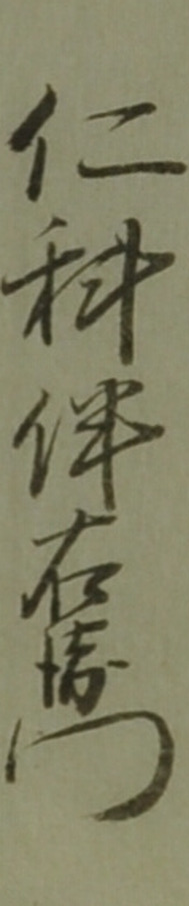仁科伴右衛門
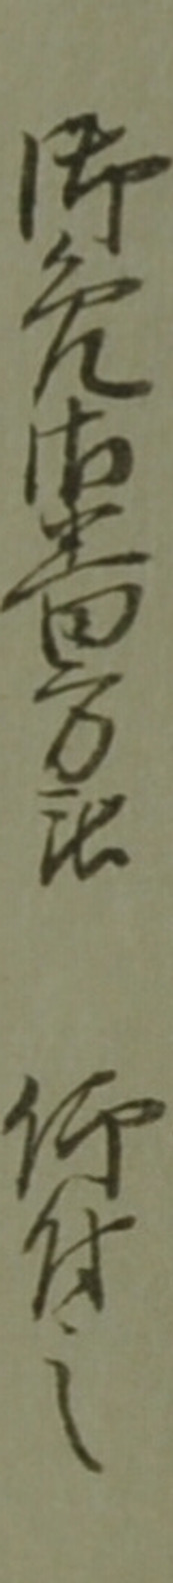御免御番方被仰付之
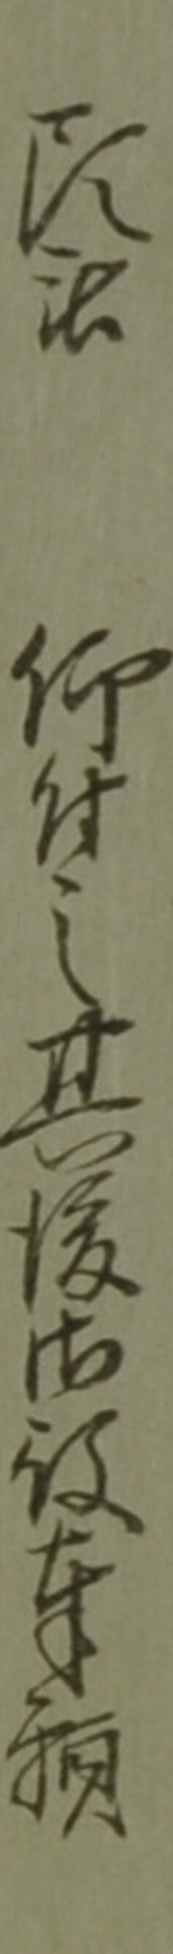頭被仰付之其後御役奉預
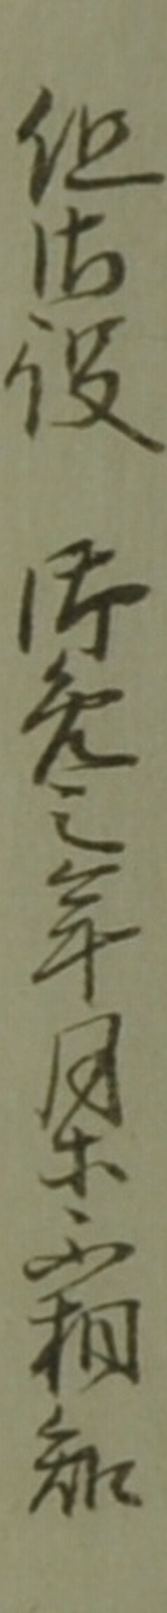但御役御免之年月等不相知
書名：諸御役代々録（六）
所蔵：伊那市立高遠町図書館・合同会社AMANE
